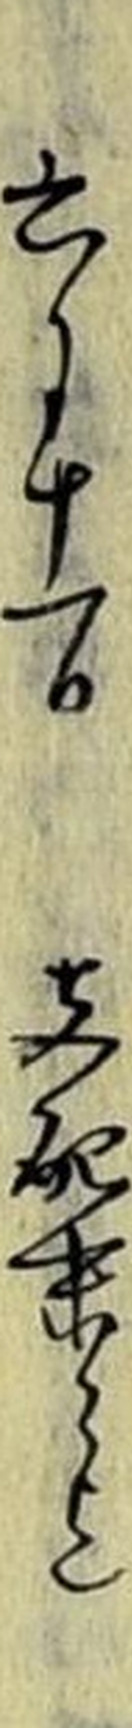六月十一日支配末々迄
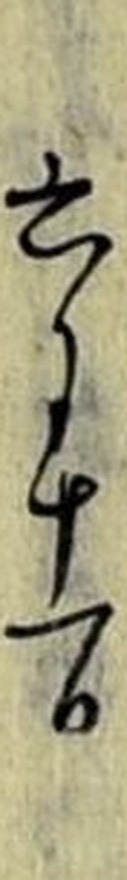五月十九日
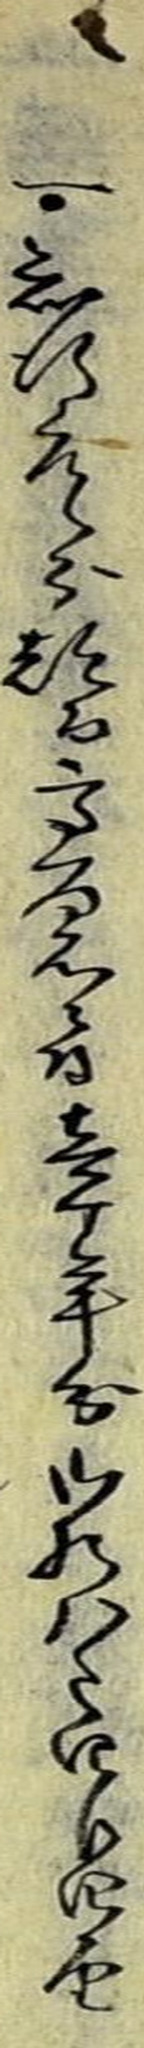一知行取之分都而高百石に付壱ヶ年分弐拾八匁四分四厘
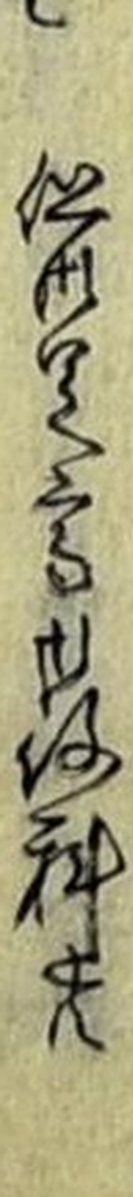但御足高御役料共
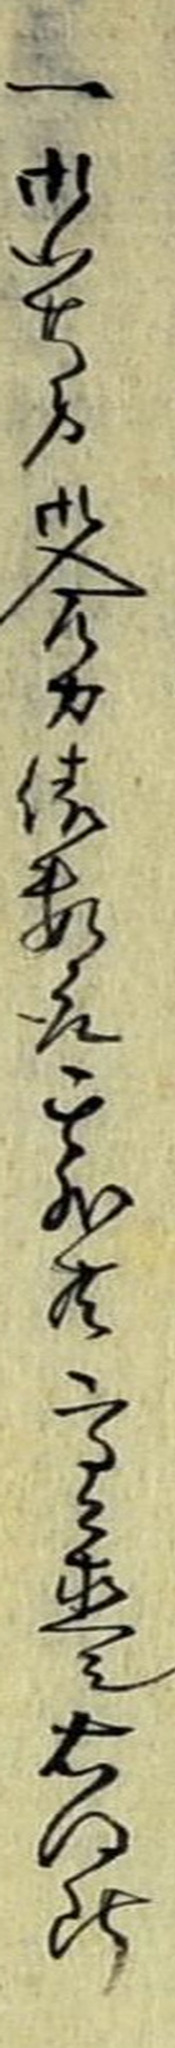一御ふち方御合力俵数取其外共高に直し右同断
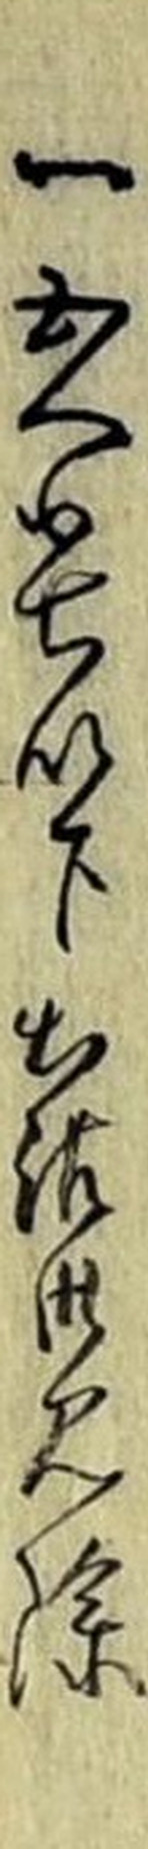一五人ふち以可出銀御見除
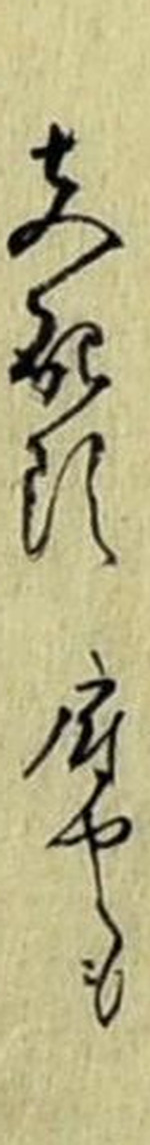支配頭府中へも
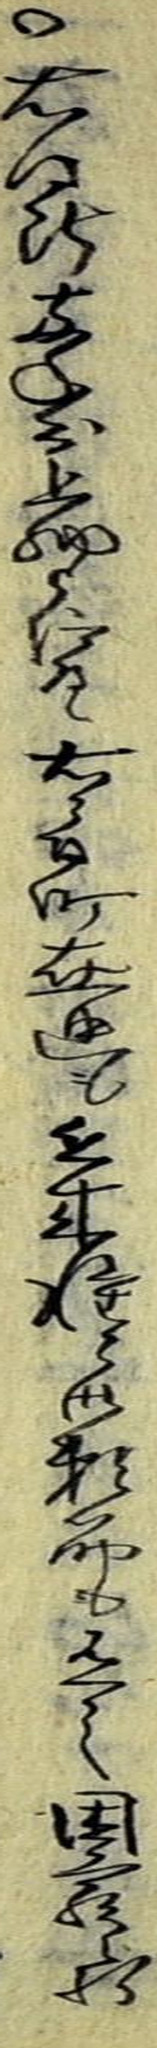○右同断両年分上納被仰付候右に付町在迚も近来種々御頼筋も有之困窮之折
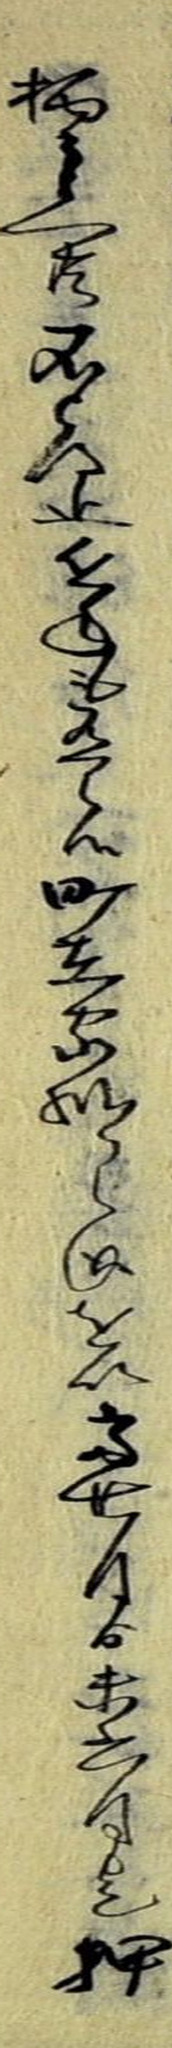柄に候へ共不被得止近年も有之候町在家掛り之趣を以当七月ゟ未六月迄押

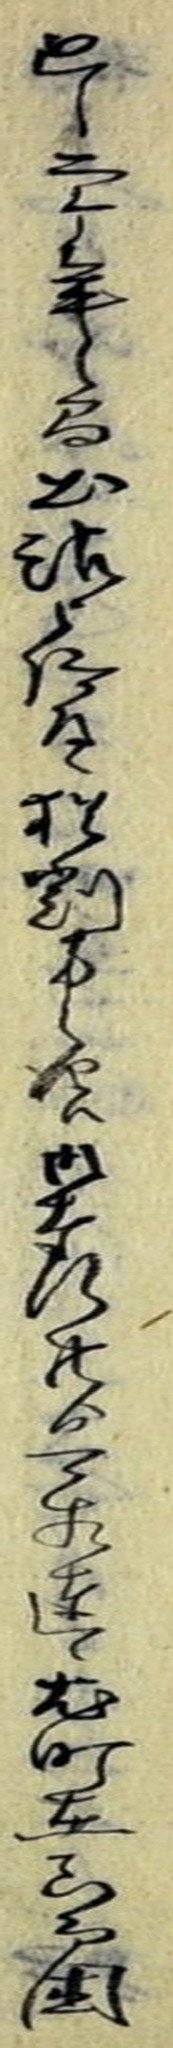廻し二ヶ年之間出銀被仰付候猶割方之儀は御奉行共ゟ相達候尤町在至而困
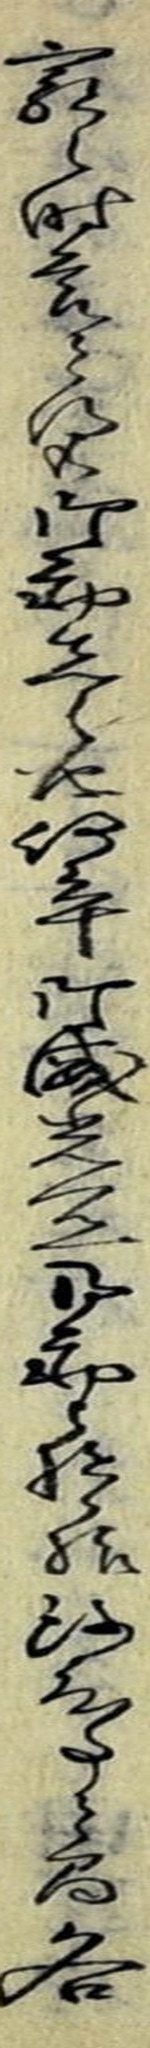窮之時節に候得共御勤先之儀何卒御威光宜御被遊候様致度事に候間各
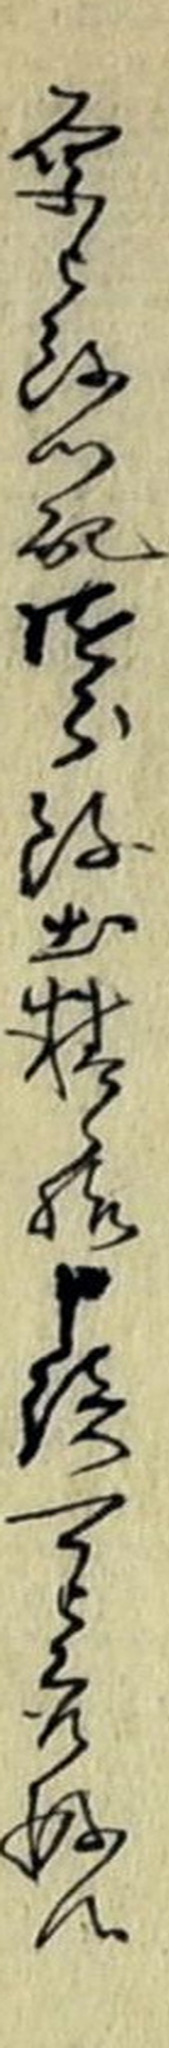厚被致心配随分致出精候様申談可被取扱候
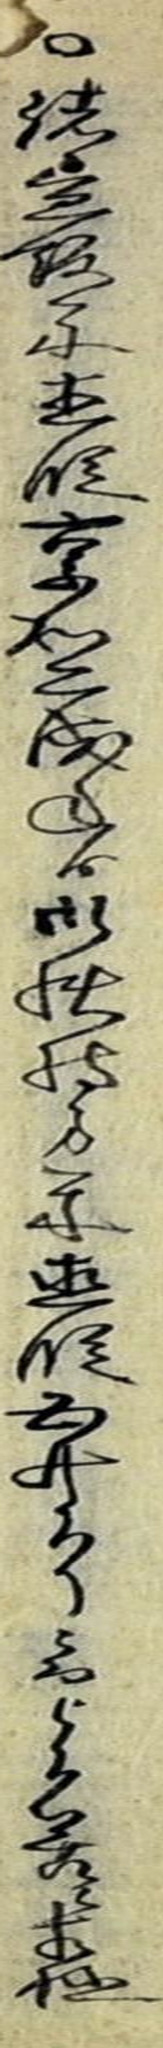○諸昼飯米直段享和二戌年ゟ御扶持方米直段五升下りに而被下筈に相極
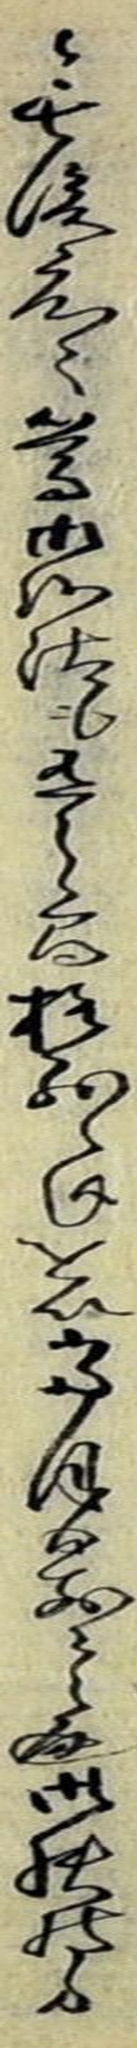候其後度々嵩御沙汰も有之候間格別之趣を以当月ゟ前々之通御扶持方
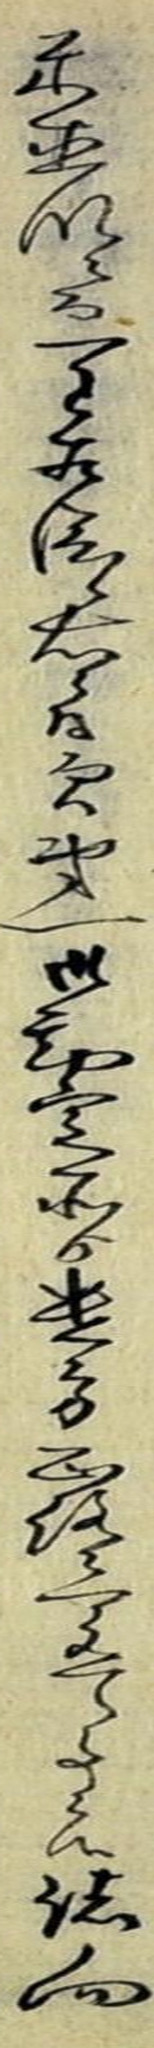米直段に而可被相渡候右に付而は第一御勘定所ゟ幾方正路に可有之事に候諸向
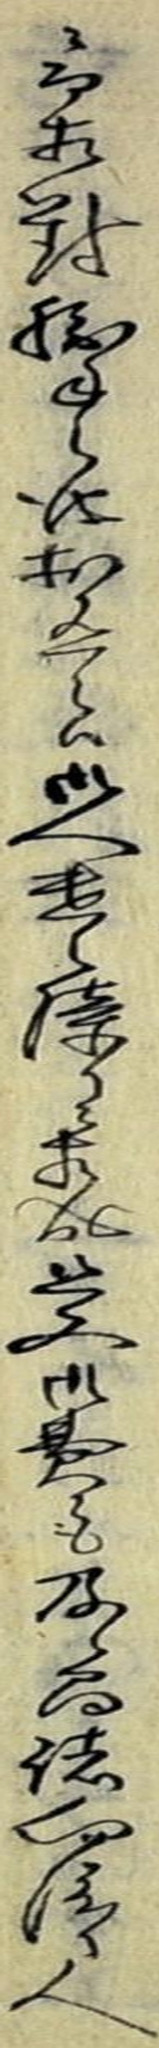に而相対勝手之儀於有之は御人遣之障りに相成且又御費にも及候間諸向渡り人
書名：命令之部 四
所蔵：福井県文書館 Fukui Prefectural Archives
